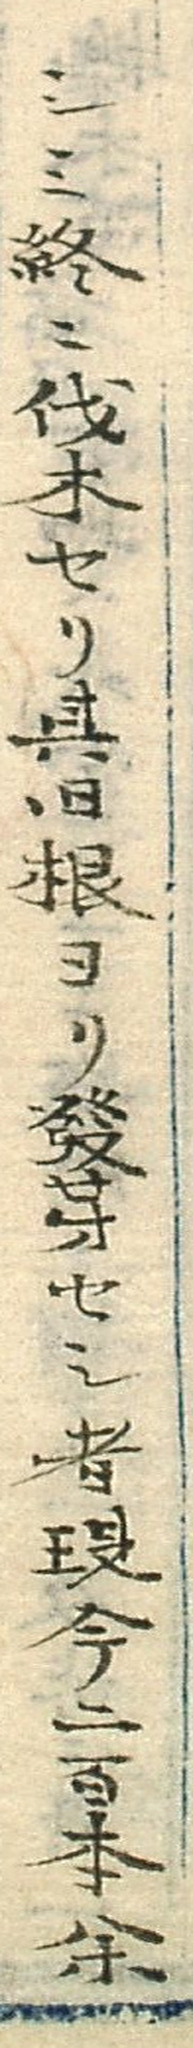シミ終ニ伐木セリ其旧根ヨリ発芽セシ者現今二百本余
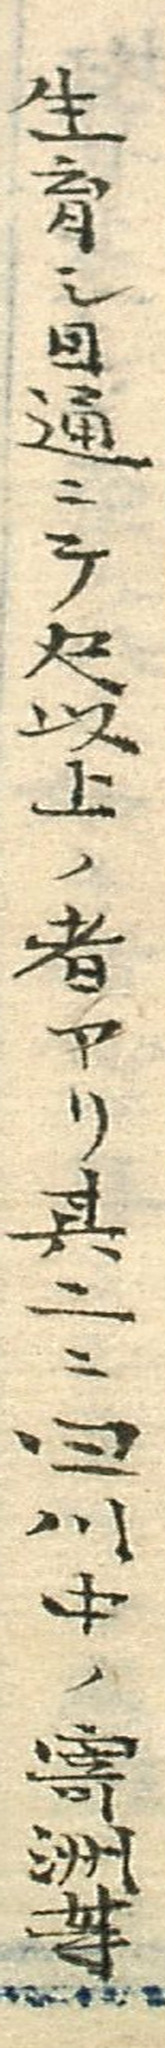生育シ目通ニテ尺以上ノ者アリ其二ニ曰川中ノ寄洲等
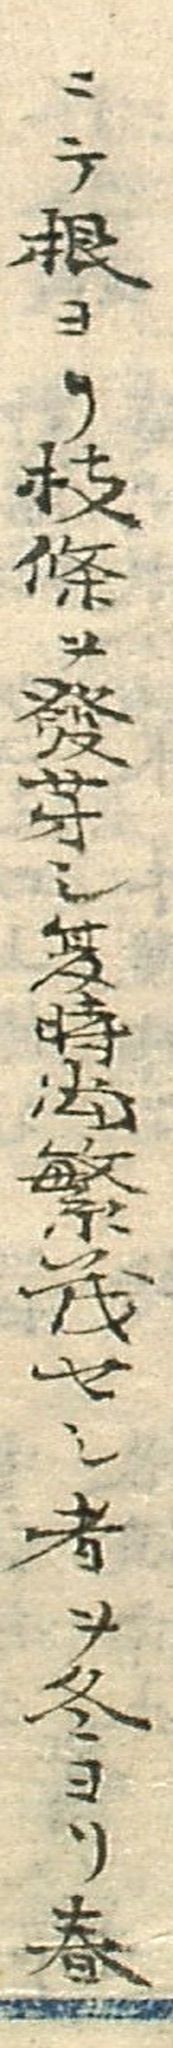ニテ根ヨリ枝条ヲ発芽シ夏時尚繁茂セシ者ヲ冬ヨリ春
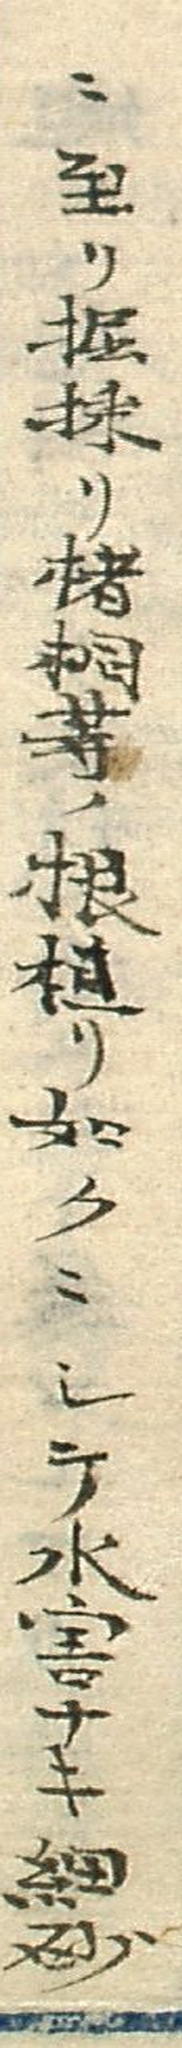ニ至リ掘採リ楮桐等ノ根植リ如クニシテ水害ナキ細砂
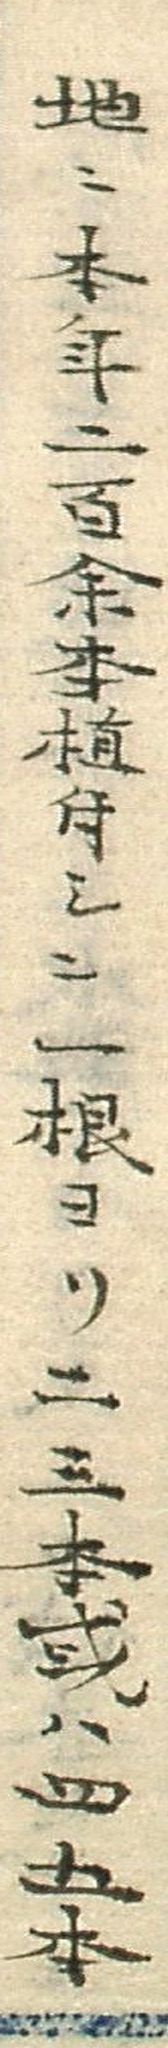地ニ本年二百余本植付シニ一根ヨリ二三本或ハ四五本
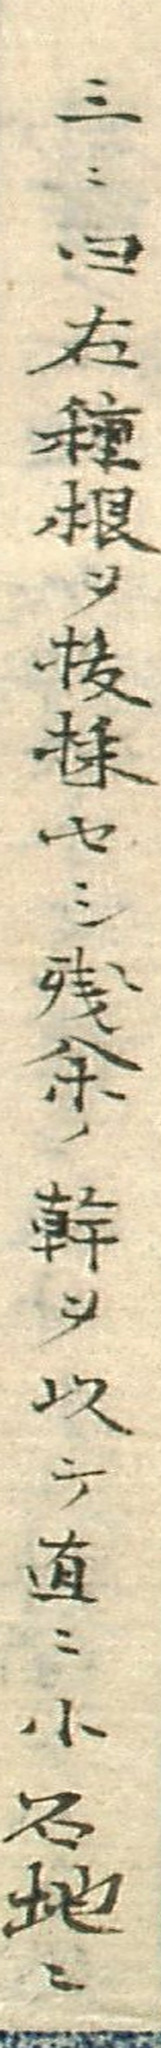三ニ曰右種根ヲ抜採セシ残余ノ幹ヲ以テ直ニ小石地ニ
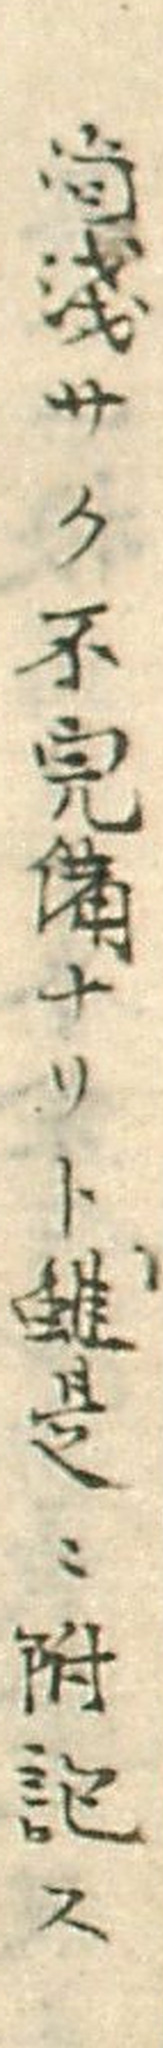尚浅サク不完備ナリト雖是ニ附記ス

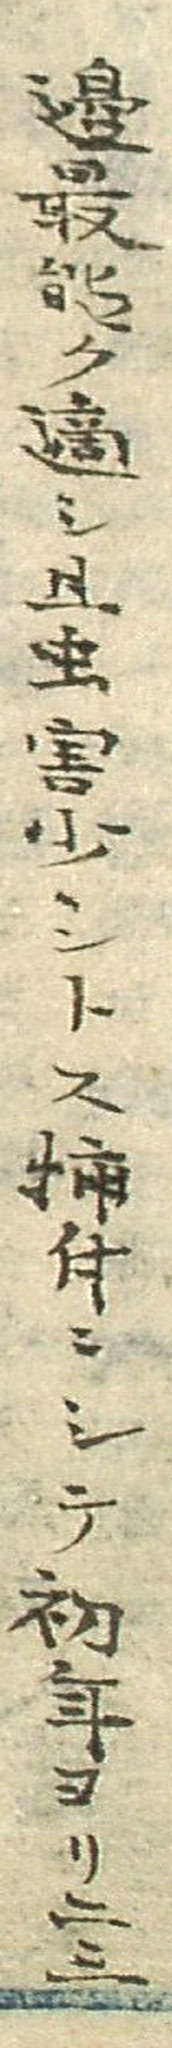辺最能ク適シ且虫害少シトス挿付ニシテ初年ヨリ二三
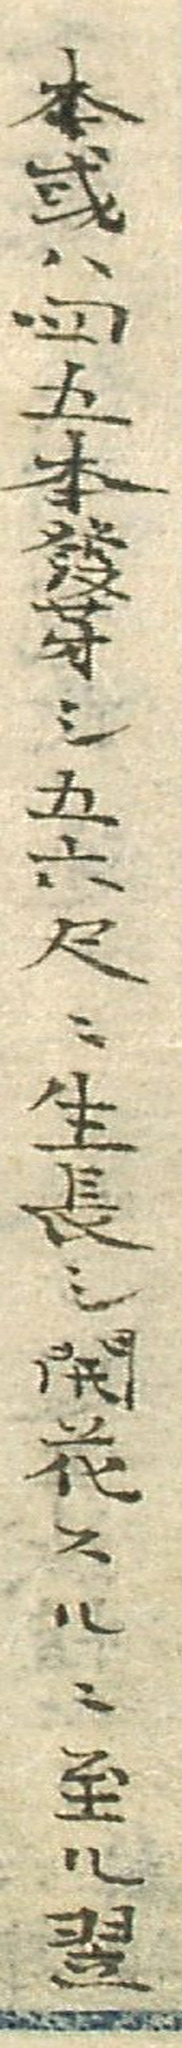本或ハ四五本発芽シ五六尺ニ生長シ開花スルニ至ル翌
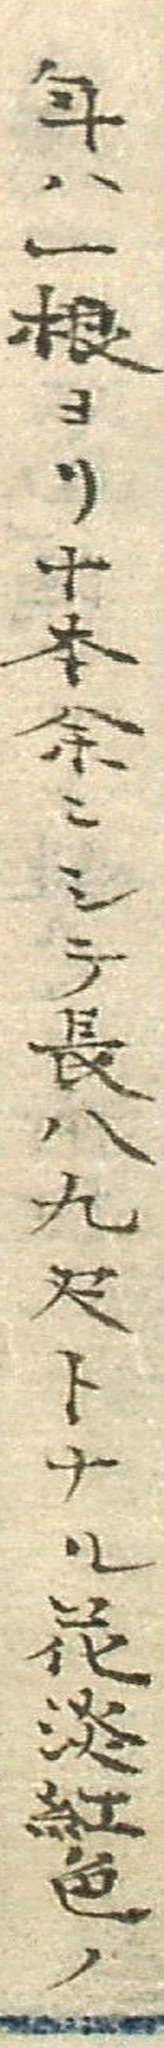年ハ一根ヨリ十本余ニシテ長八九尺トナル花淡紅色ノ
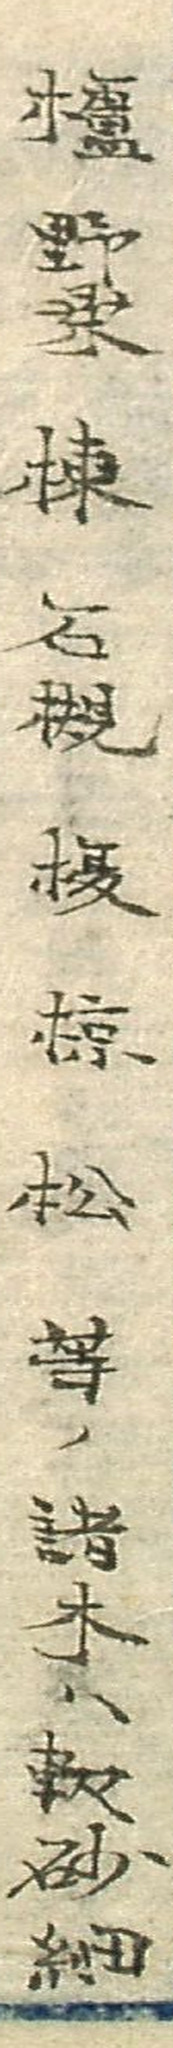櫨野桑楝石槻榎椋松等ノ諸木ハ軟砂細
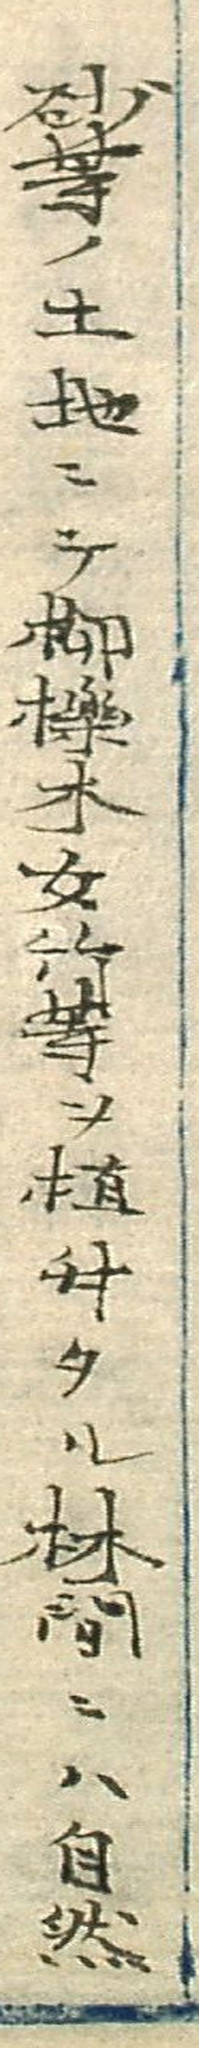砂等ノ土地ニテ柳櫟木女竹等ヲ植付タル林間ニハ自然
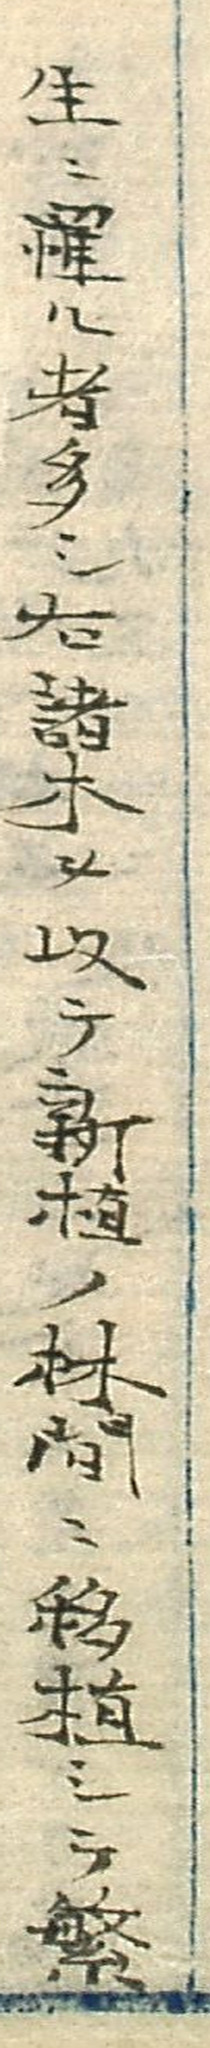生ニ罹ル者多シ右諸木ヲ以テ新植ノ林間ニ移植シテ繁
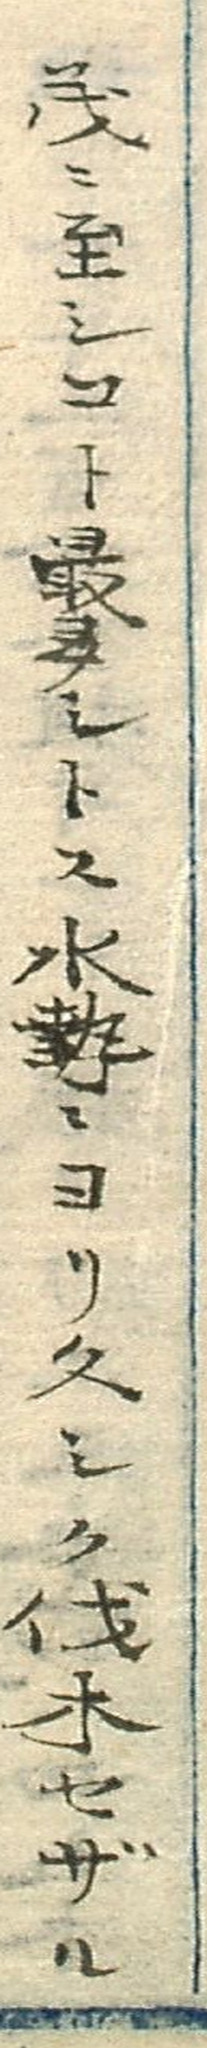茂ニ至シコト最多シトス水勢ニヨリ久シク伐木セザル
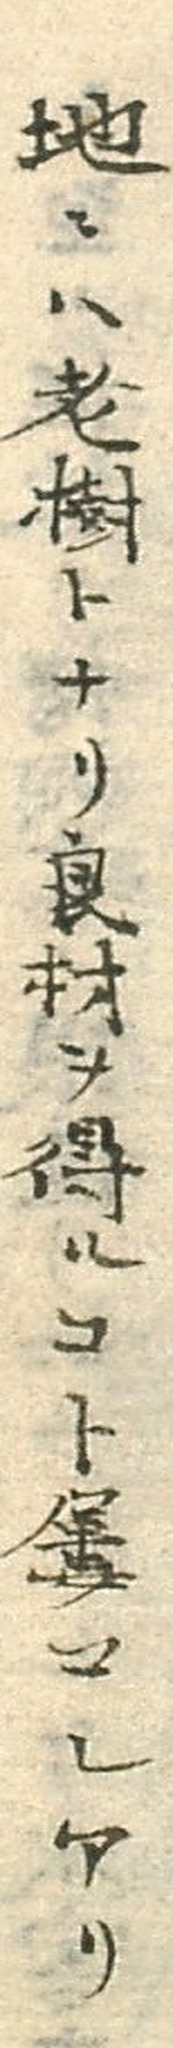地ニハ老樹トナリ良材ヲ得ルコト屡コレアリ
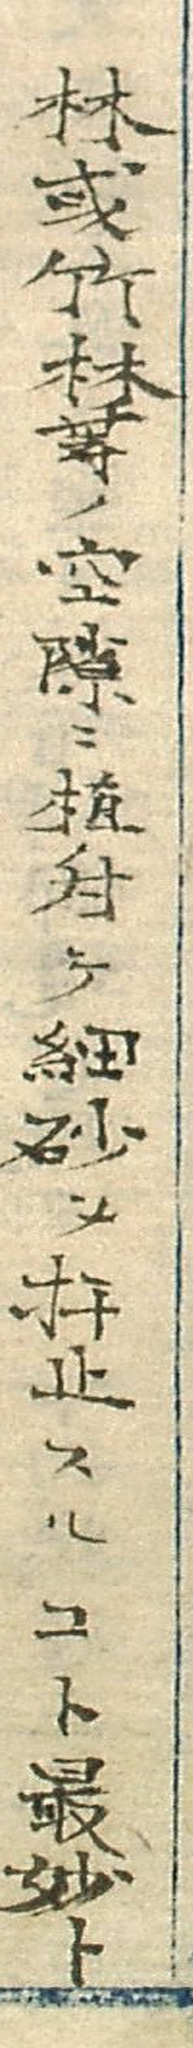林或竹林等ノ空隙ニ植付ケ細砂ヲ扞止スルコト最妙ト
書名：山林共進会取調書
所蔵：鳴門教育大学 Naruto University of Education
